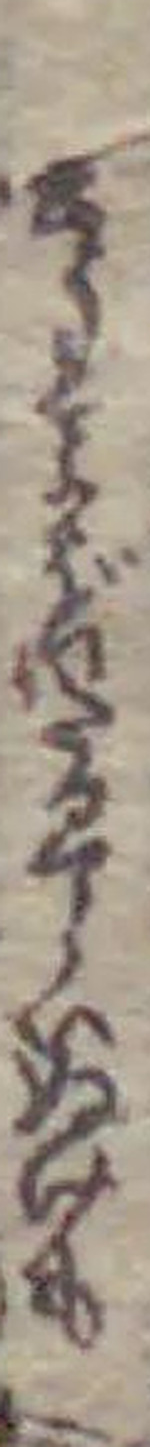とうとよばれたるくらいぬけも
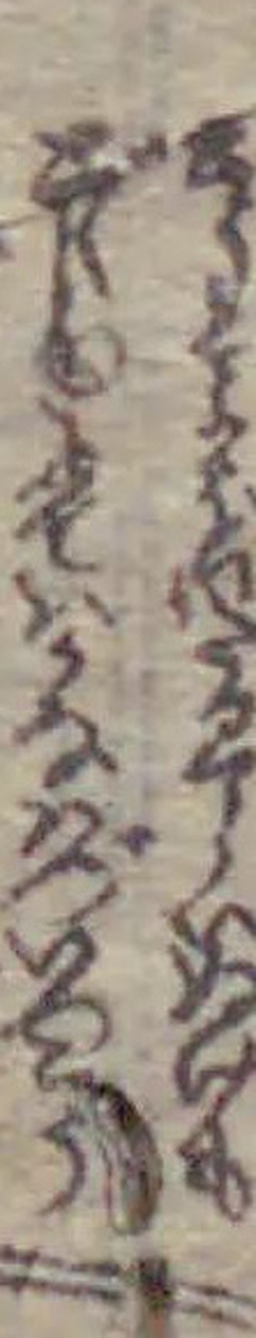どくしゆにてはかなはづいつこう
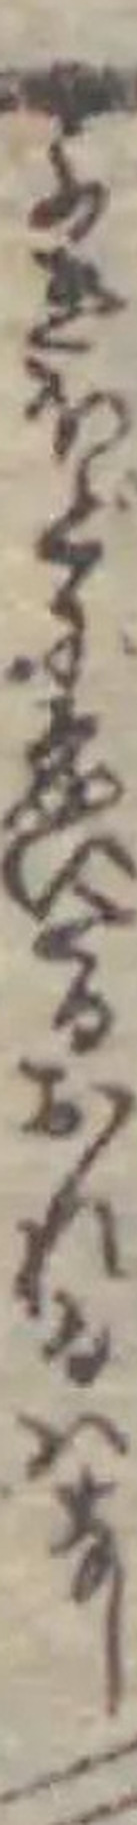よきほどにゑいたるおれるはなし
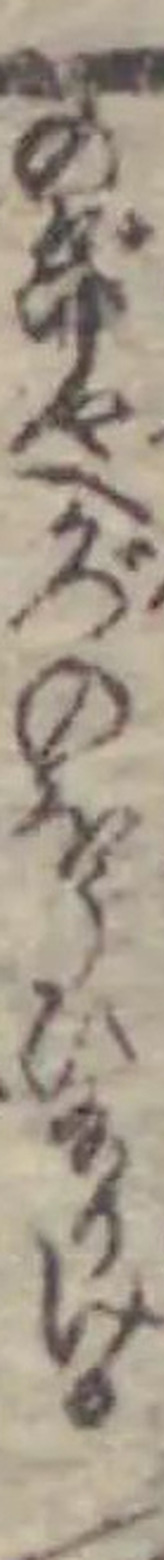のげいしやへかづのほうひ給りける
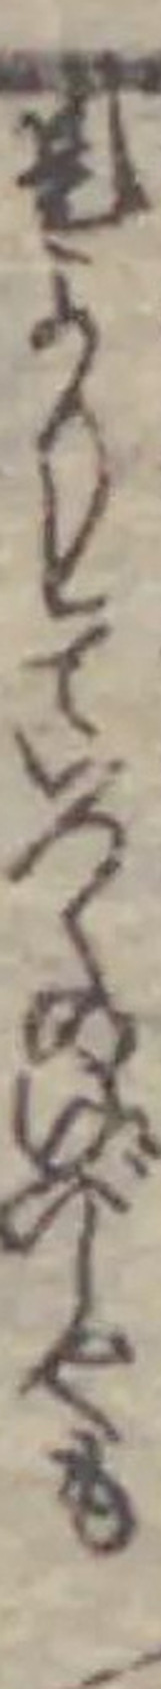是よりしていつくのげいしやも
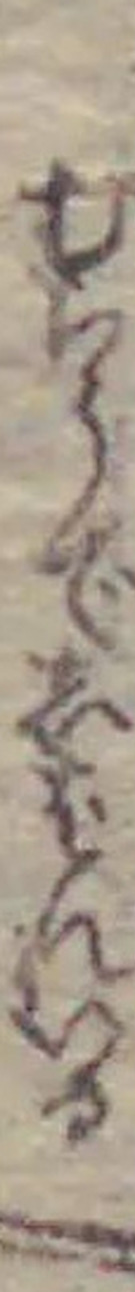むちうでしばれいる
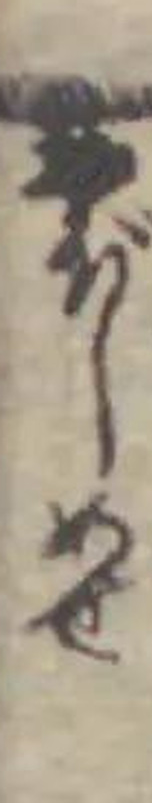おぼしめせ
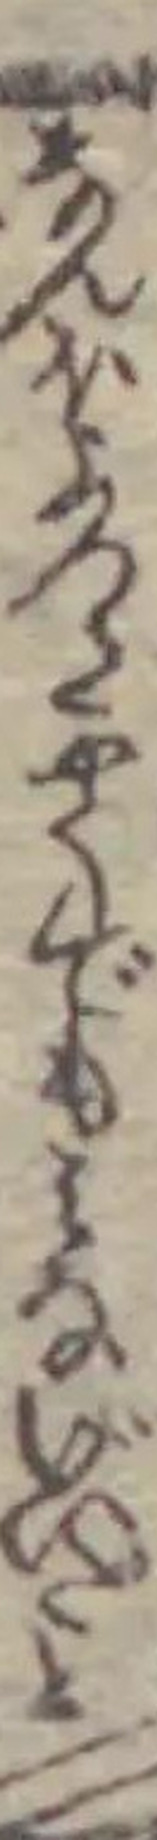なんほよつたやうでもみなげいだと

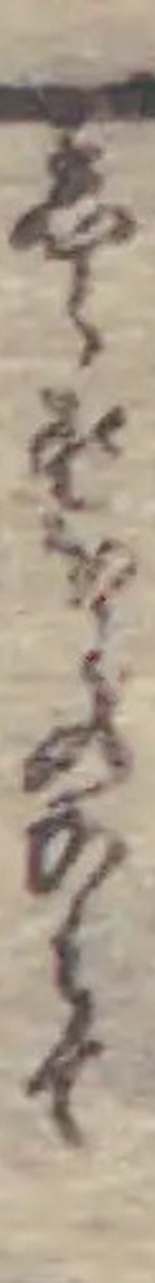しらずほどのかみて
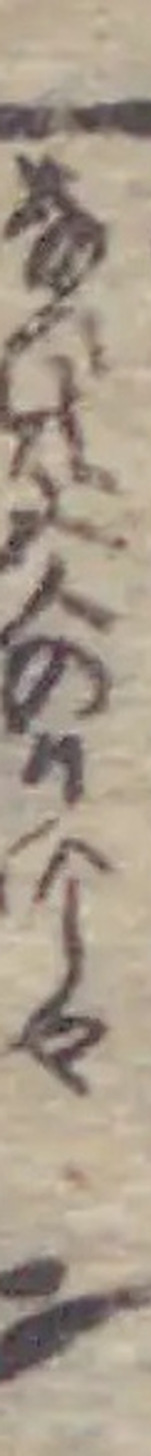なれ共五人のけいしや
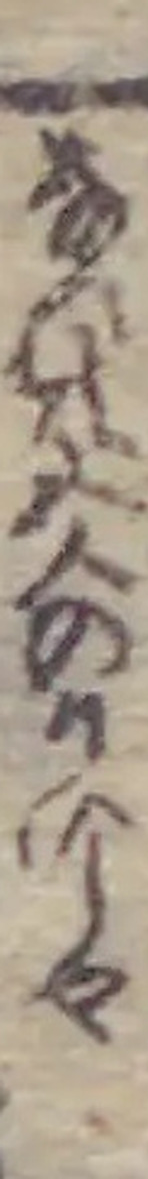なれ共五人のけいしや
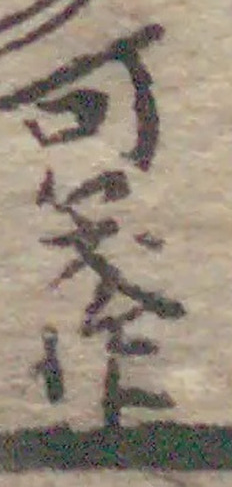可笑作
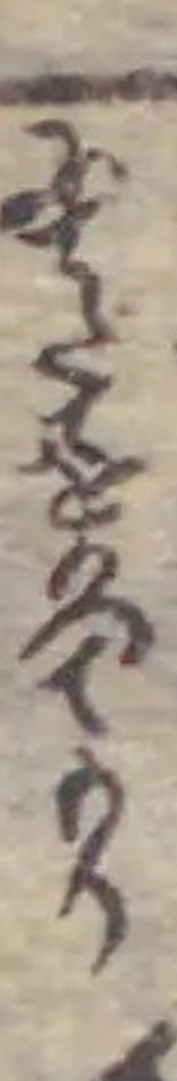にてたてをもつてもり
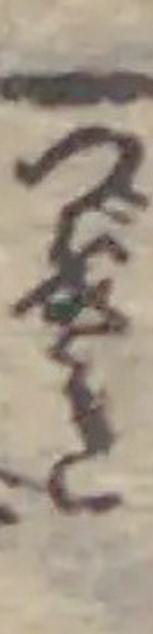つぶされ
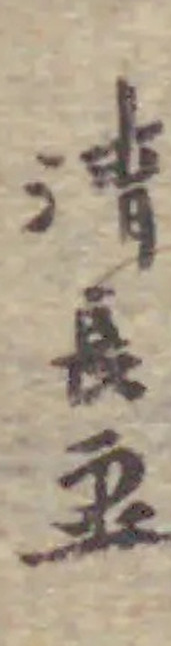清長画
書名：藝者五人娘 2巻
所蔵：国立国会図書館 National Diet Library, JAPAN
